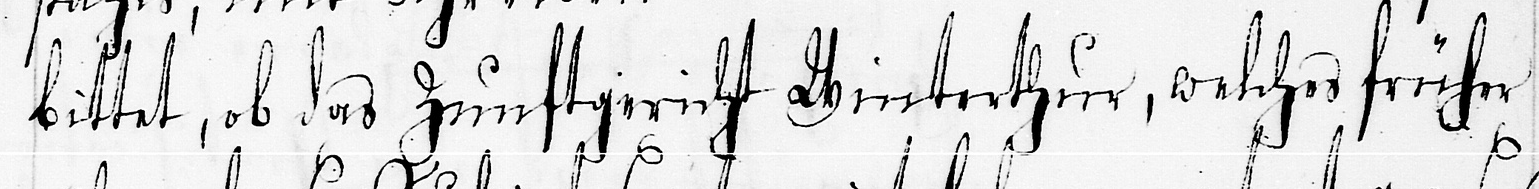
bittet, ob das Zunftgericht Winterthur, welches früher
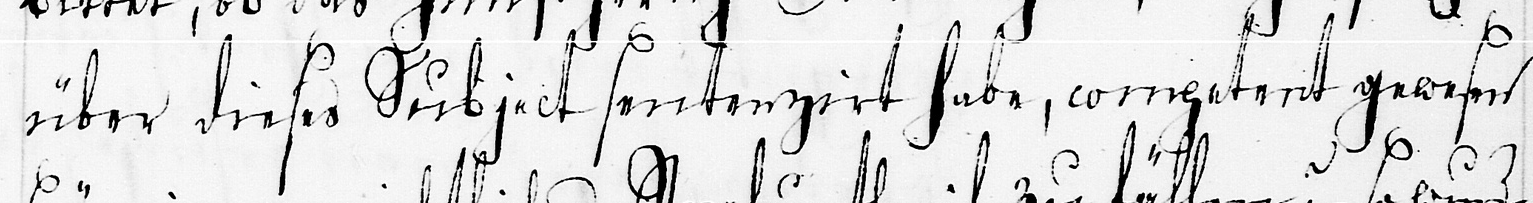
über dieses Subject sentenzirt habe, competent gewesen
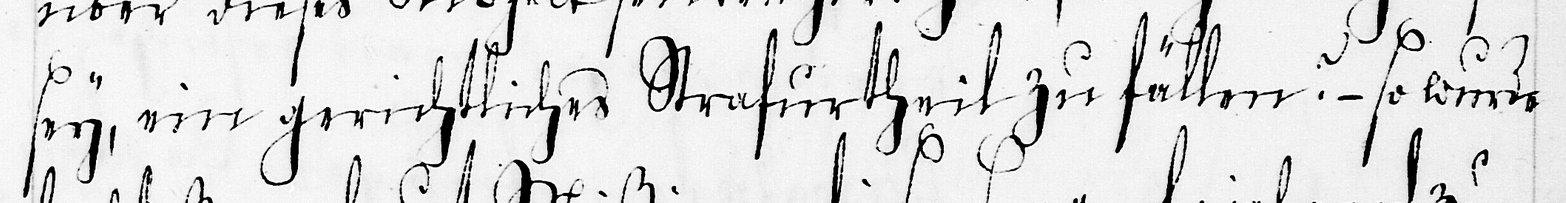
sey, ein gerichtliches Strafurtheil zu fällen? – so wurde
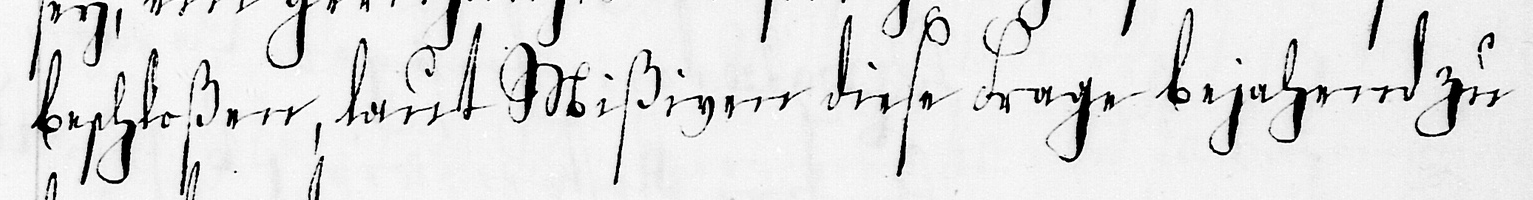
beschloßen, laut Mißiven diese Frage bejahend zu
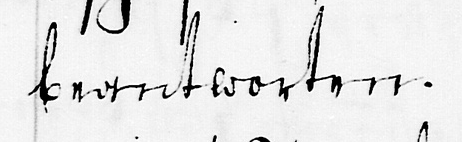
beantworten.
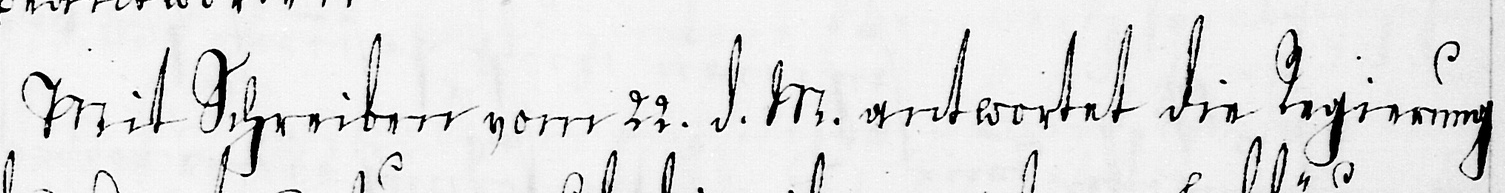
Mit Schreiben vom 22. d. M. antwortet die Regierung
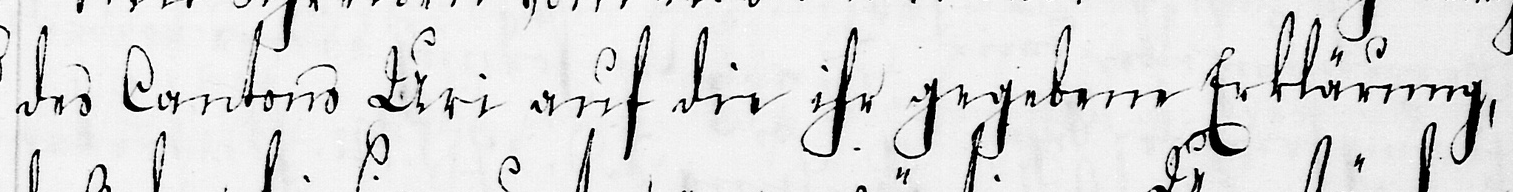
des Cantons Uri auf die ihr gegebene Erklärung,
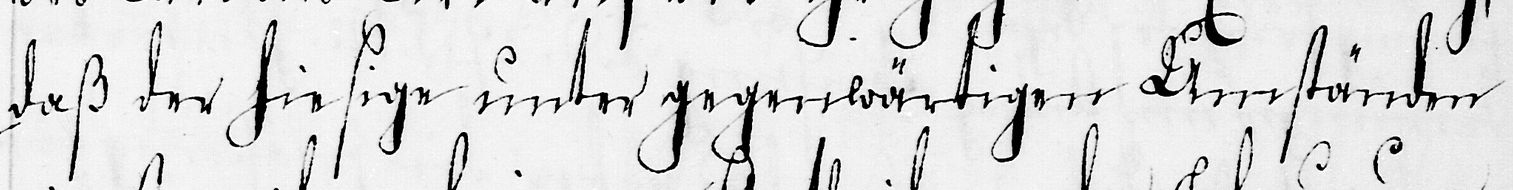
daß der hiesige unter gegenwärtigen Umständen
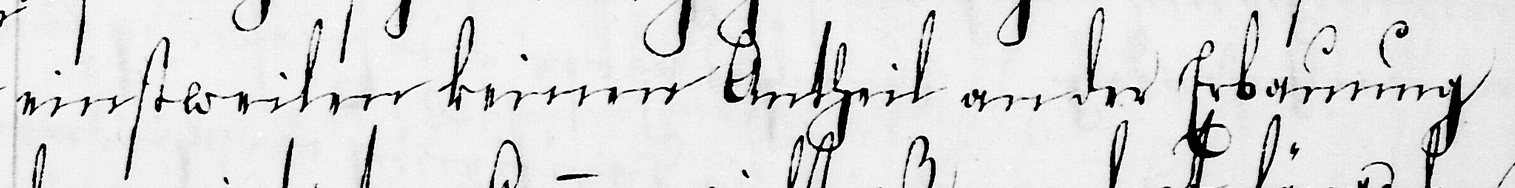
einstweilen keinen Antheil an der Erbauung
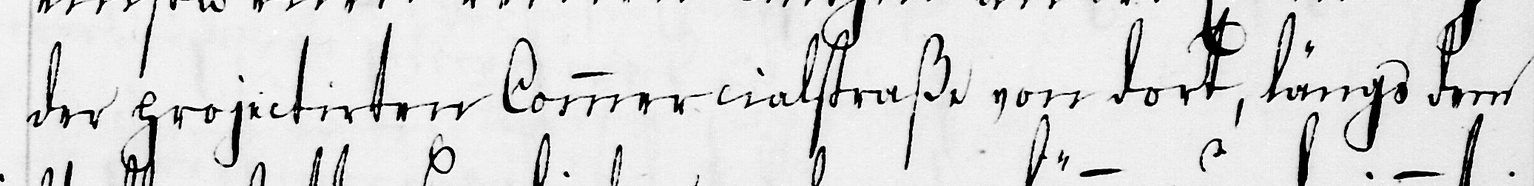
der projectirten Commercialstraße von dort, längs dem
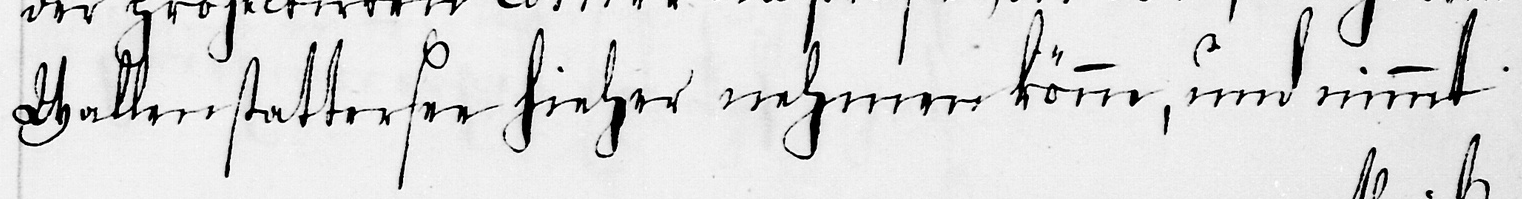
Wallenstattersee hieher nehmen könne, und nimmt
